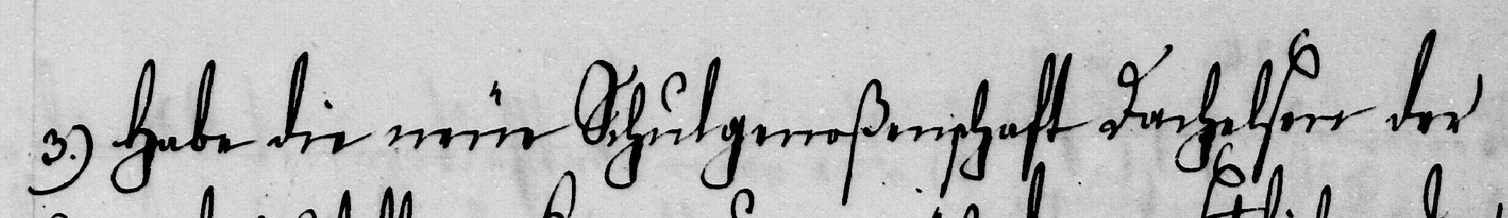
3.) Habe die neue Schulgenoßenschaft Dachelsen der
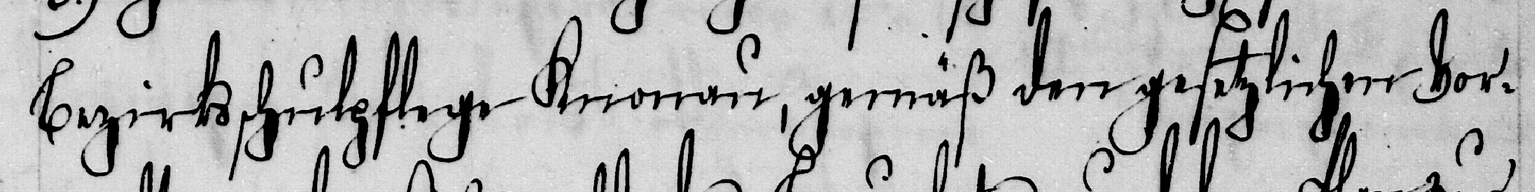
Bezirksschulpflege Knonau, gemäß den gesetzlichen Vor¬
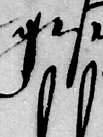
80.
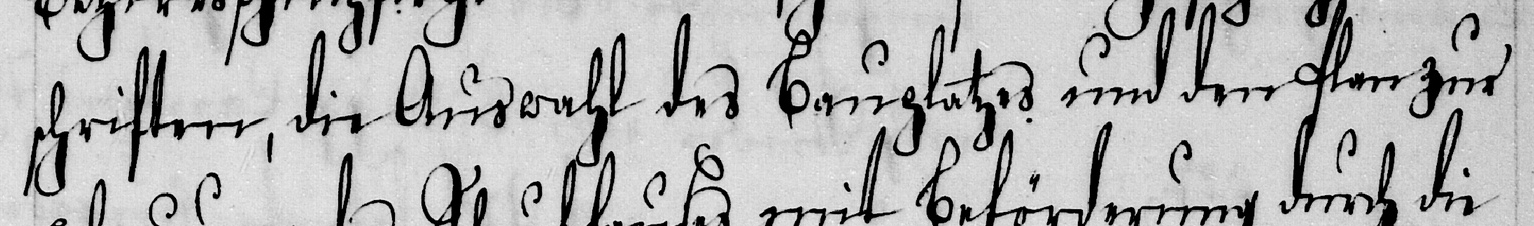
schriften, die Auswahl des Bauplatzes und den Plan zur
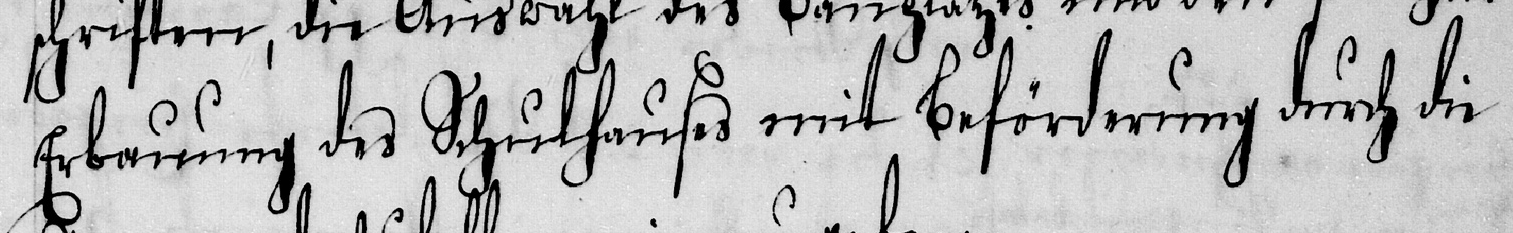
Erbauung des Schulhauses mir Beförderung durch die
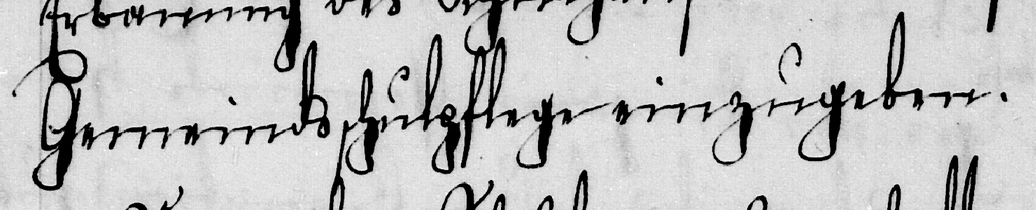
Gemeindsschulpflege einzugeben.
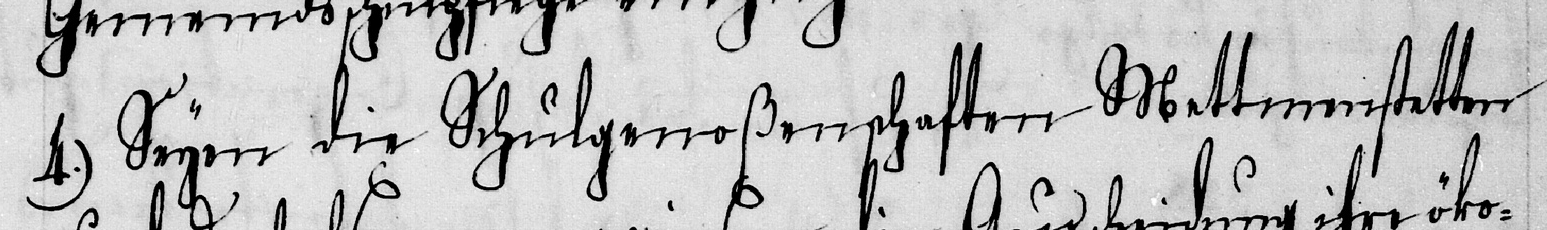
4.) Seyen die Schulgenoßenschaften Mettmenstetten
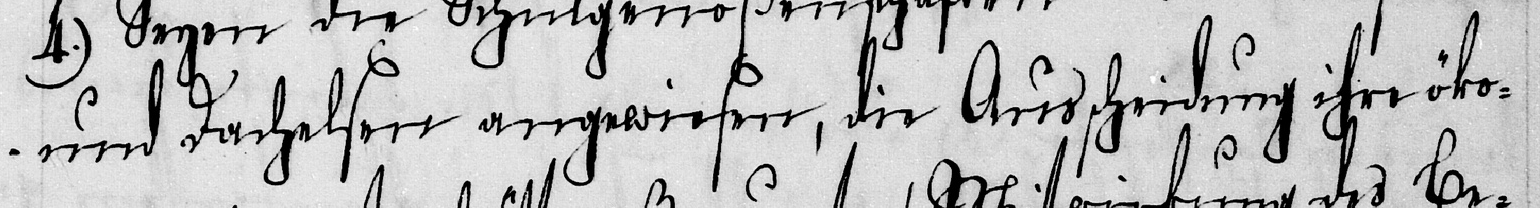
und Dachelsen angewiesen, die Ausscheidung ihre öko¬
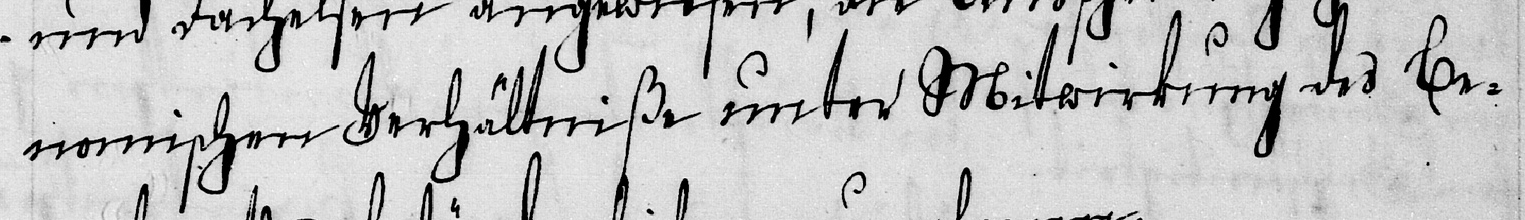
nomischen Verhältniße unter Mitwirkung des Be¬
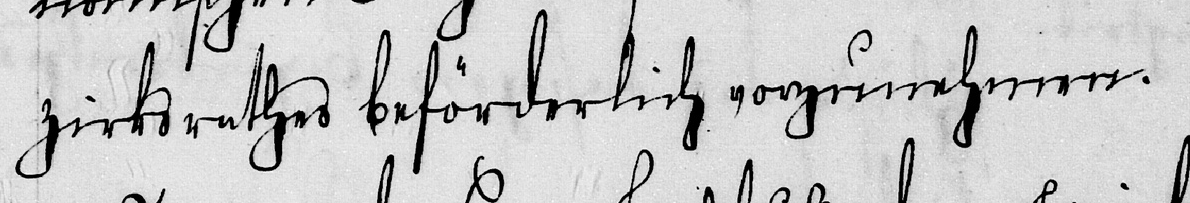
zirksrathes beförderlich vorzunehmen.
